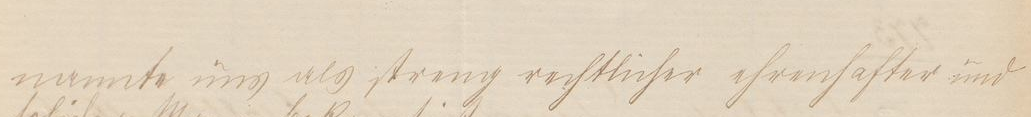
nannte uns als streng rechtlicher ehrenhafter und
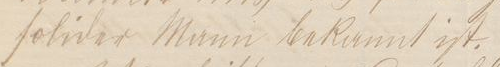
solider Mann bekannt ist.
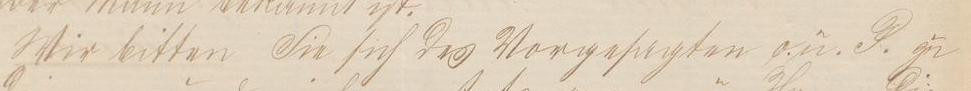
Wir bitten Sie sich des Vorgesagten o. u. P. zu
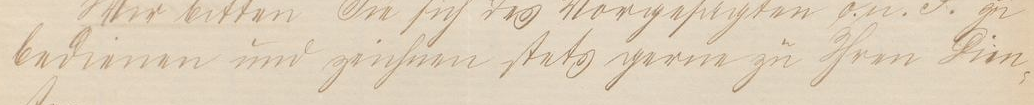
bedienen und zeichnen stets gerne zu Ihren Dien-
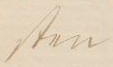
sten
